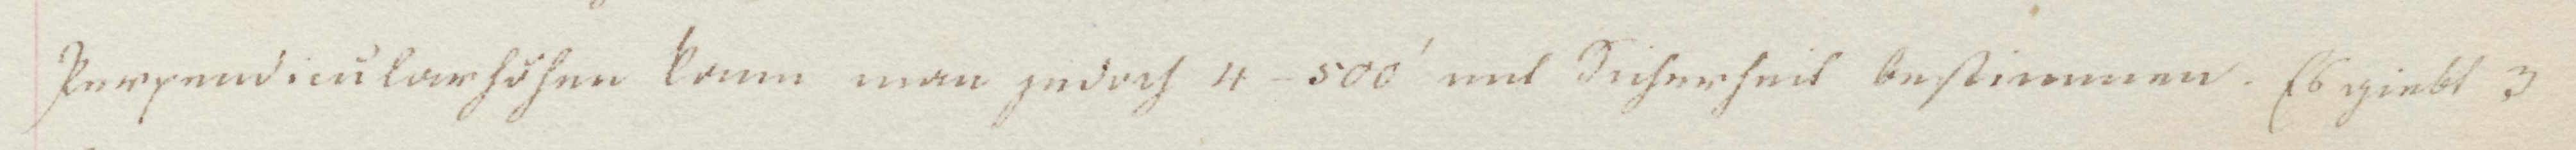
Perpendicularhöhen kann man jedoch 4–500′ mit Sicherheit bestimmen. Es giebt 3
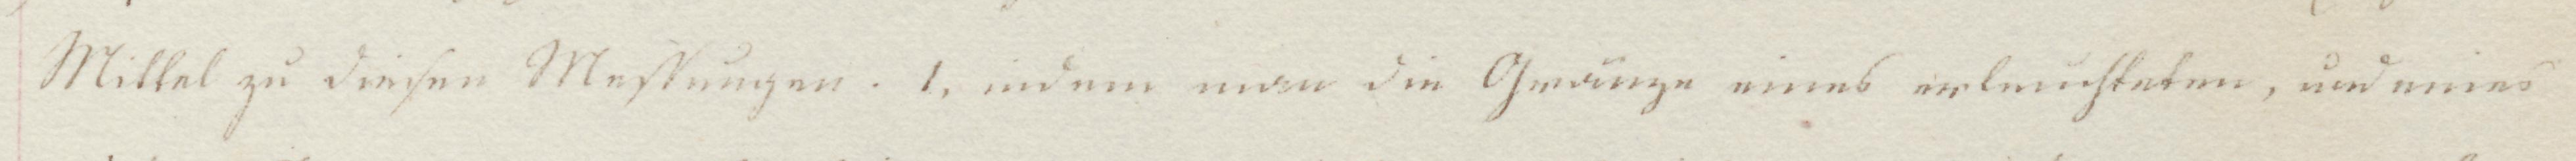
Mittel zu diesen Messungen. 1, indem man die Gränze eines erleuchteten, und eines
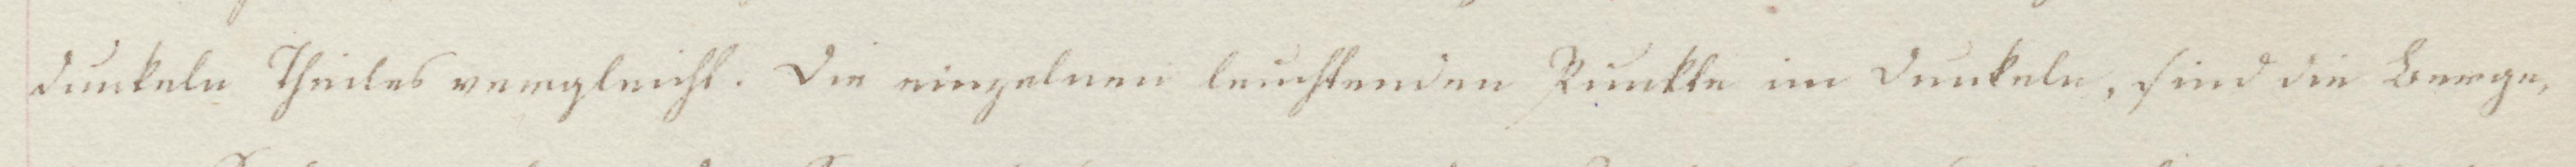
dunkeln Theiles vergleicht. Die einzelnen leuchtenden Punkte im Dunkeln, sind die Berge,
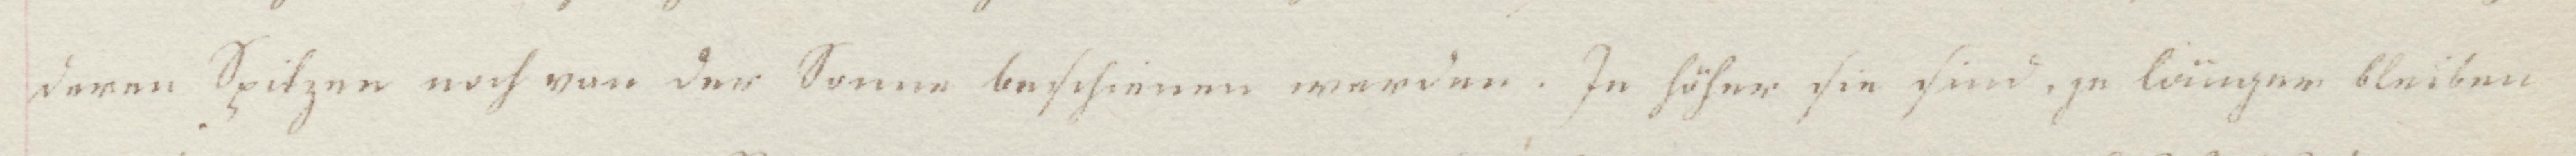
deren Spitzen noch von der Sonne beschienen werden. Je höher sie sind, je länger bleiben
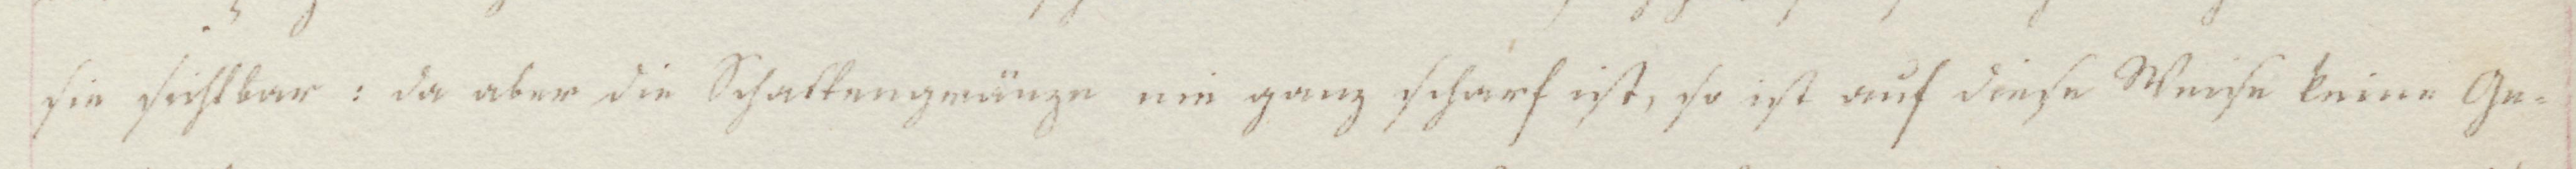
sie sichtbar: da aber die Schattengränze nie ganz scharf ist, so ist auf diese Weise keine Ge-
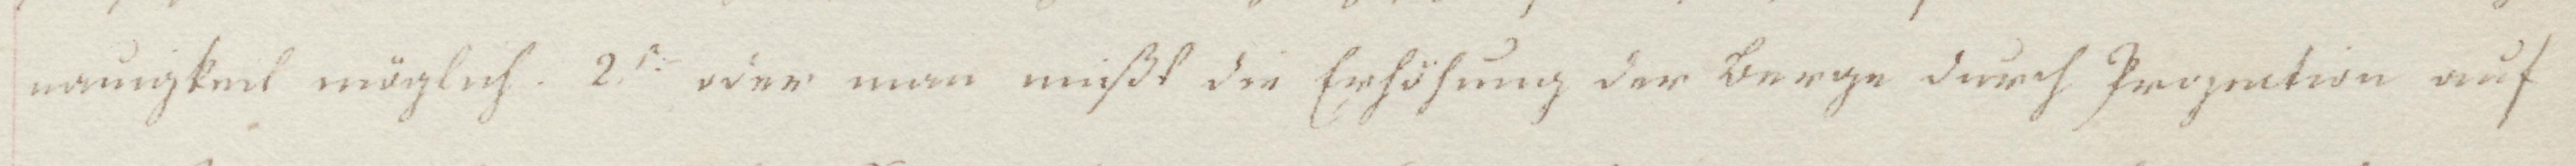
nauigkeit möglich. 2t￼ oder man mißt die Erhöhung der Berge durch Projection auf
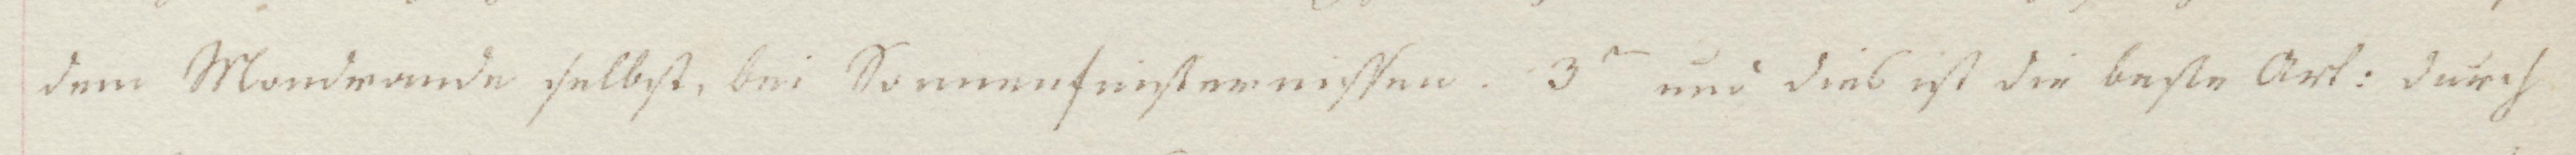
dem Mondrande selbst, bei Sonnenfinsternissen. 3t￼ und dies ist die beste Art: durch
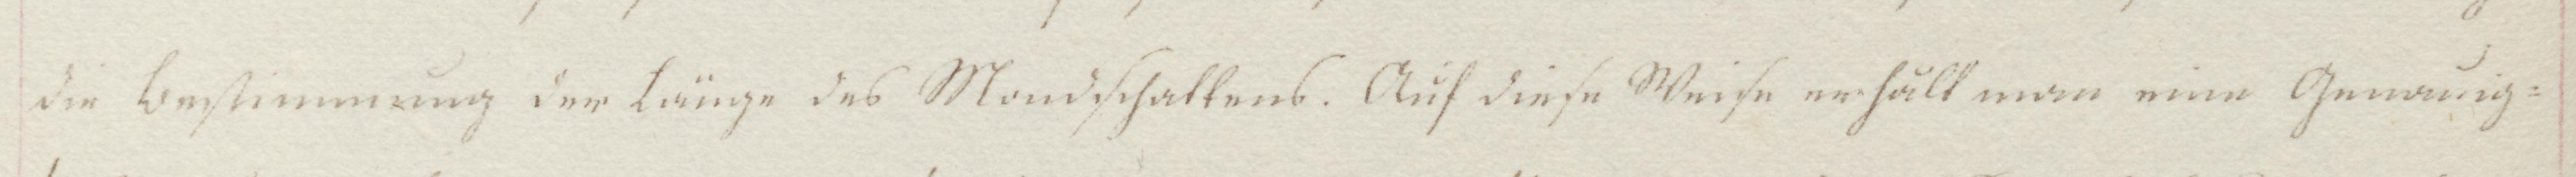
die Bestimmung der Länge des Mondschattens. Auf diese Weise erhält man eine Genauig-
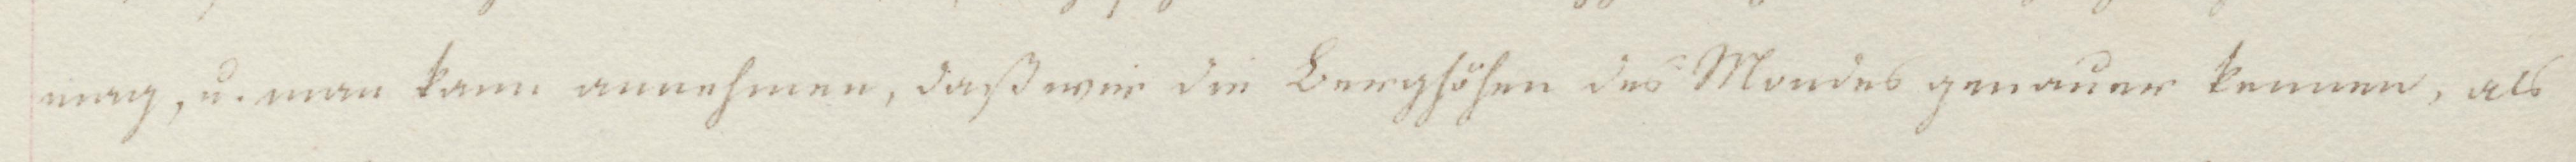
mag, u. man kann annehmen, daß wir die Berghöhen des Mondes genauer kennen, als
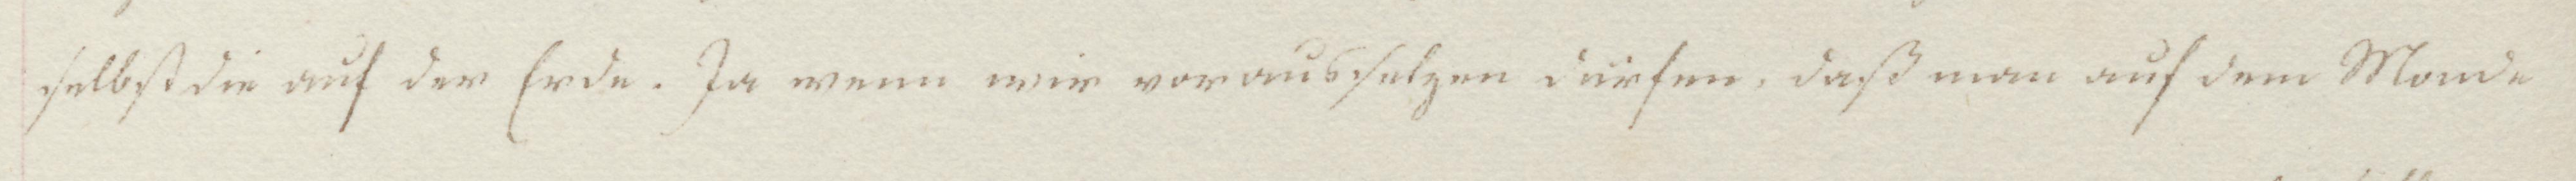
selbst die auf der Erde. Ja wenn wir voraussetzen dürfen, daß man auf dem Monde
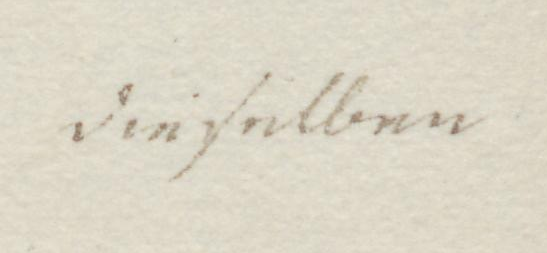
dieselben
